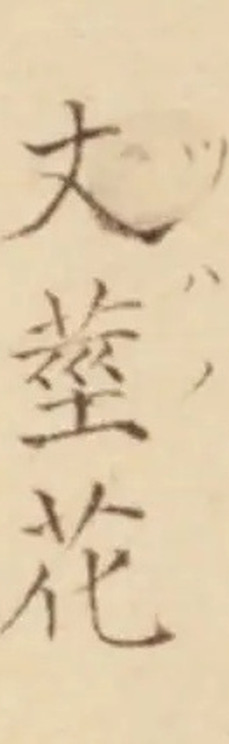丈茎花
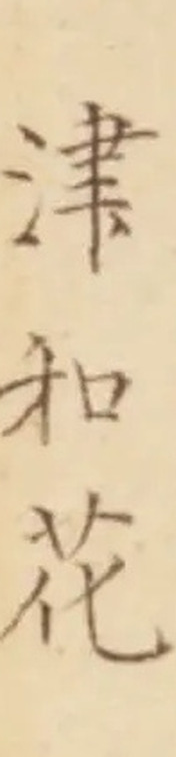津和花
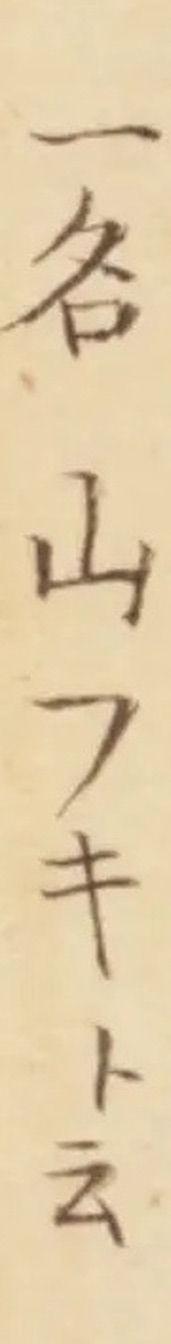一名山フキ云
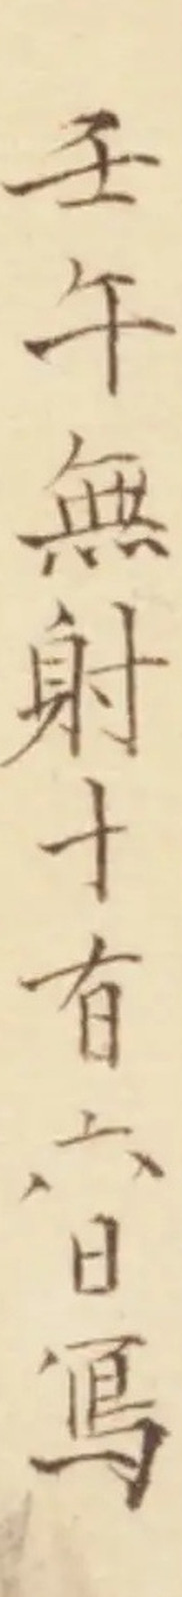壬午無射十有六日写

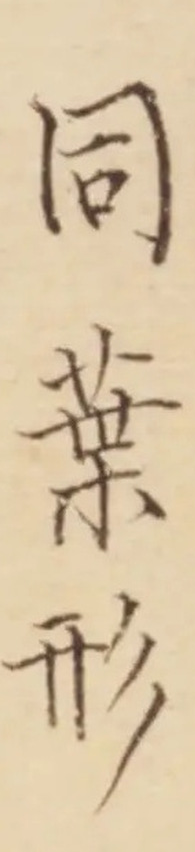同葉形

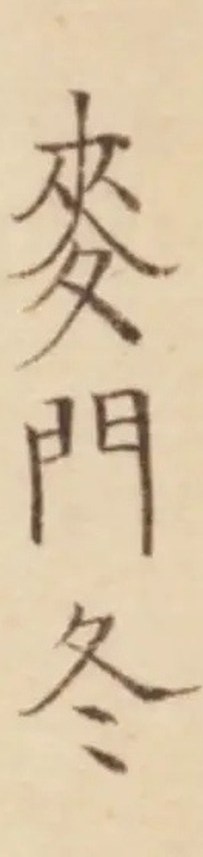麦門冬
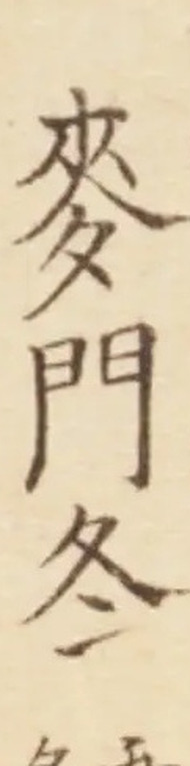麦門冬
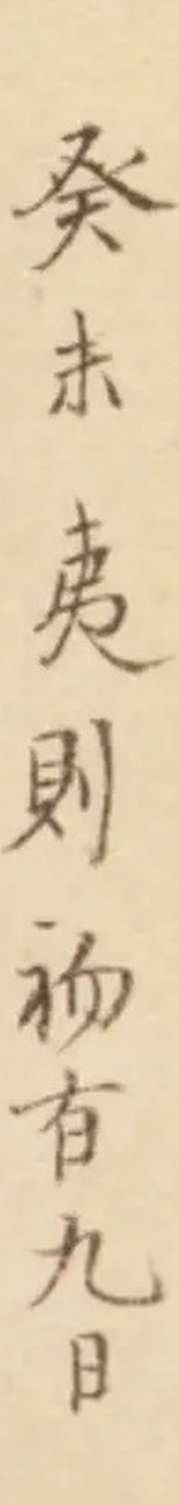癸未夷則有九日
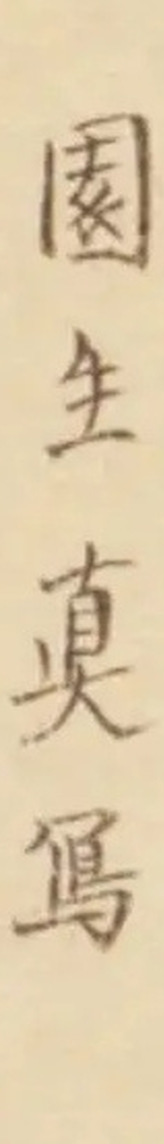園生真写

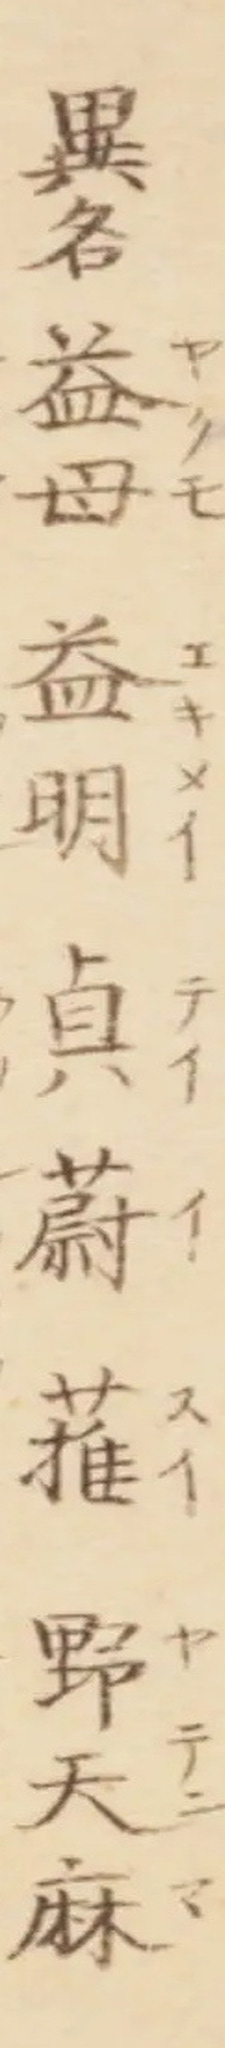異名益母益明貞蔚蓷野天麻
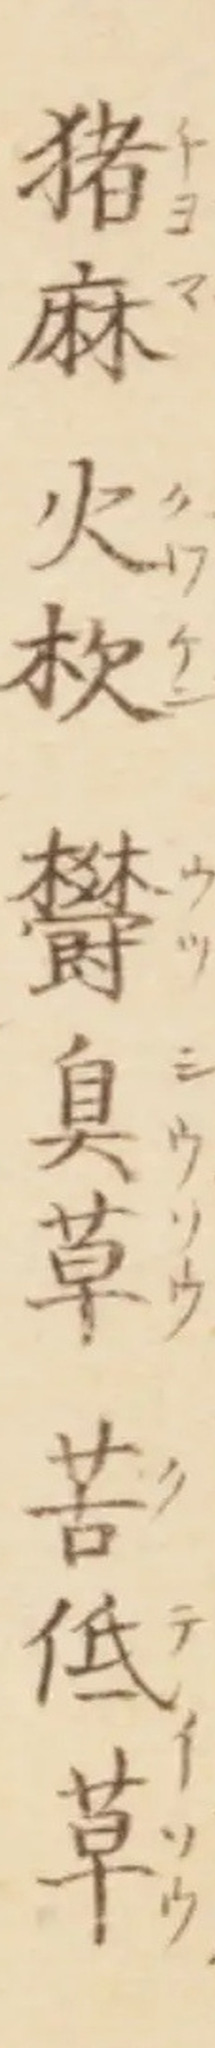猪麻火杴鬱臭草苦低草
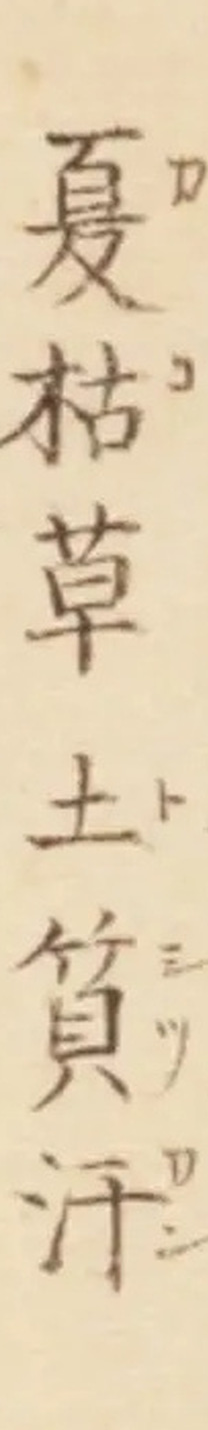夏枯草土筫汗
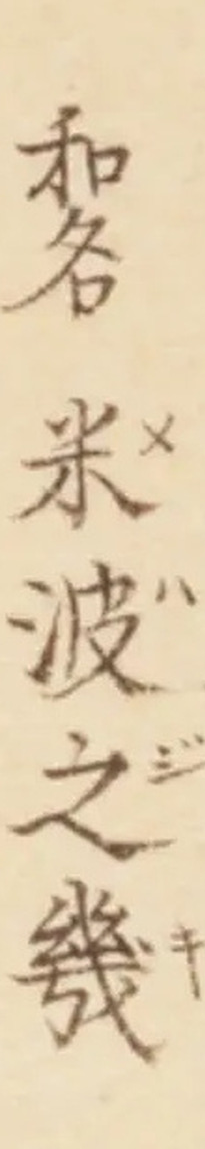和名米波之幾
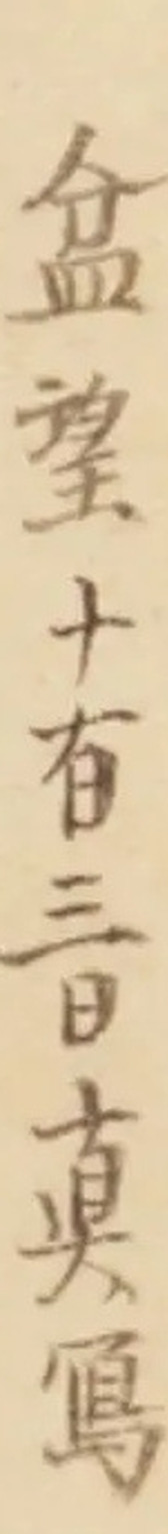盆望十有三日真写

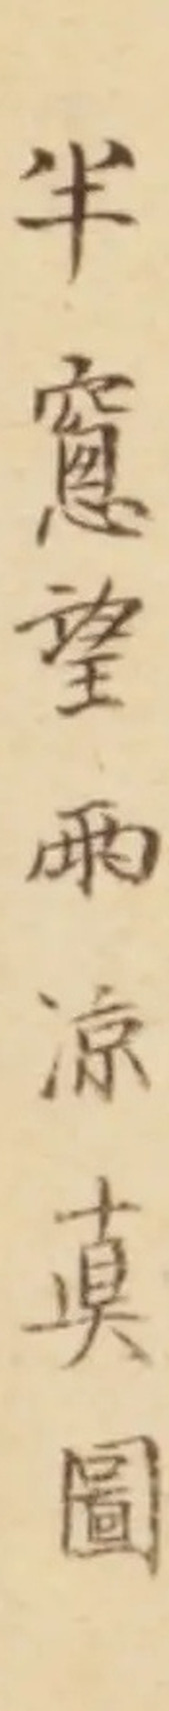半窓望雨凉真図

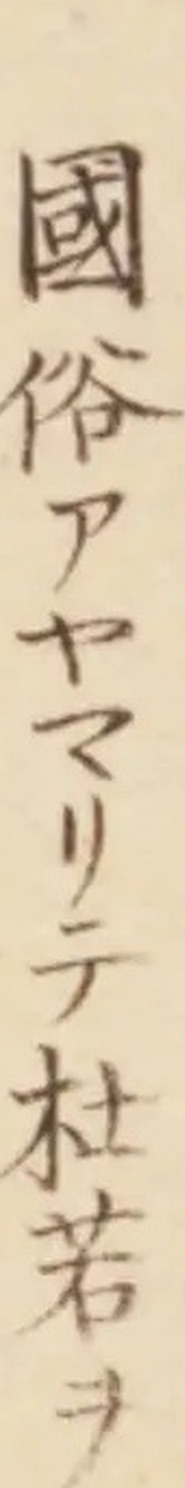国俗アヤマリテ杜若ヲ
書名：梅園草木花譜秋之部. 1
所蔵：国立国会図書館 National Diet Library, JAPAN
